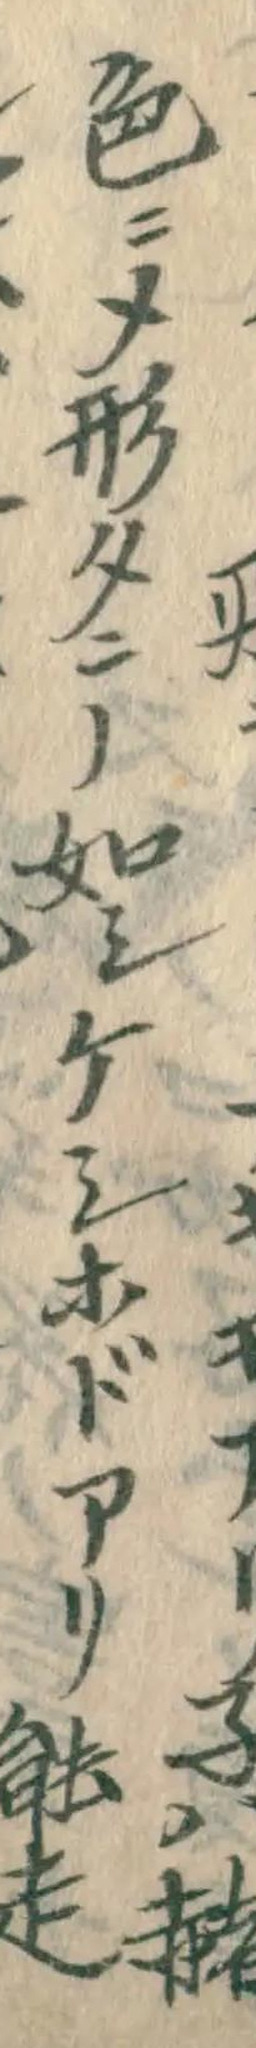色ニシテ形タニノ如シケシホドアリ能走
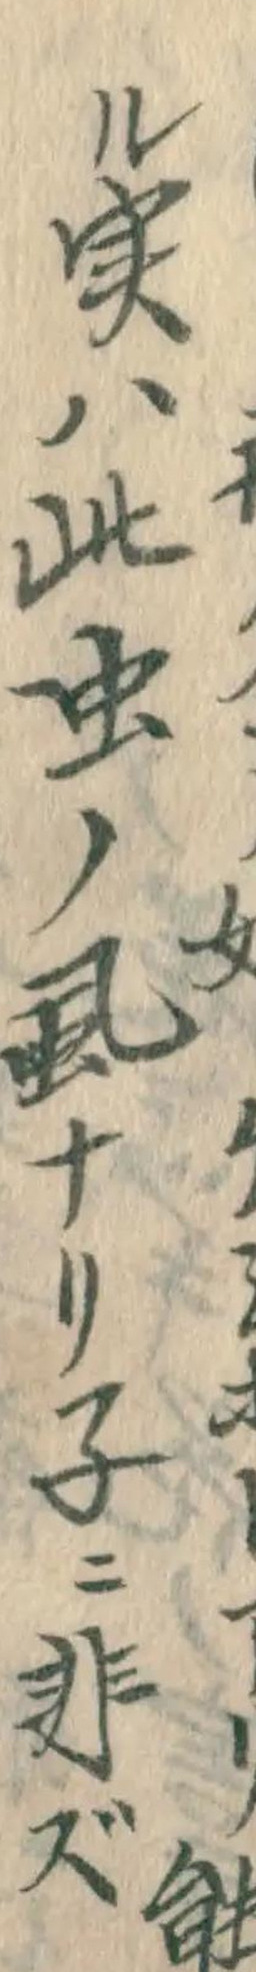ル実ハ此虫ノ虱ナリ子ニ非ズ

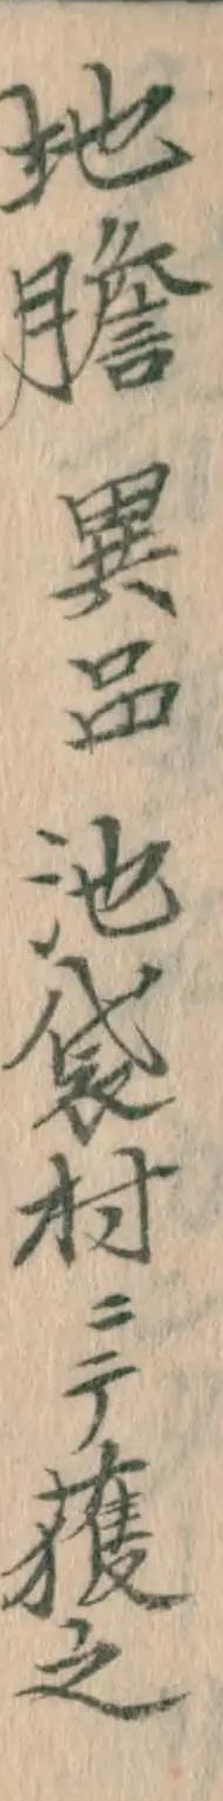地膽異品池袋村ニテ獲之
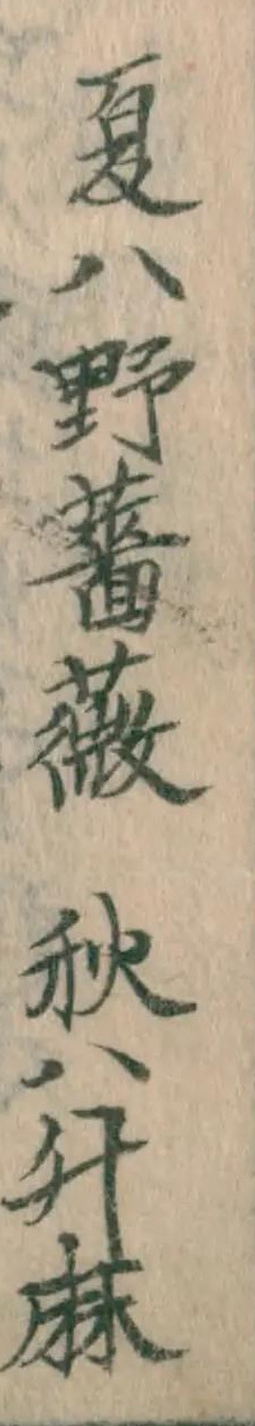夏ハ野薔薇秋ハ升麻
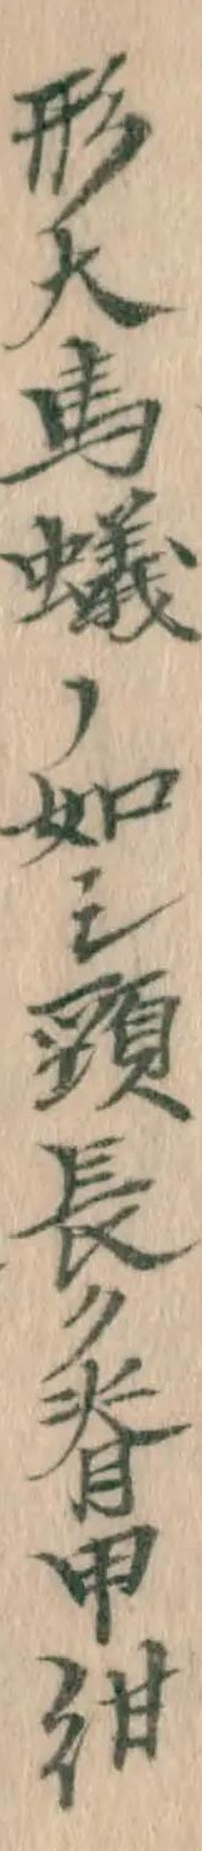形大馬蟻ノ如シ頸長ク脊甲紺
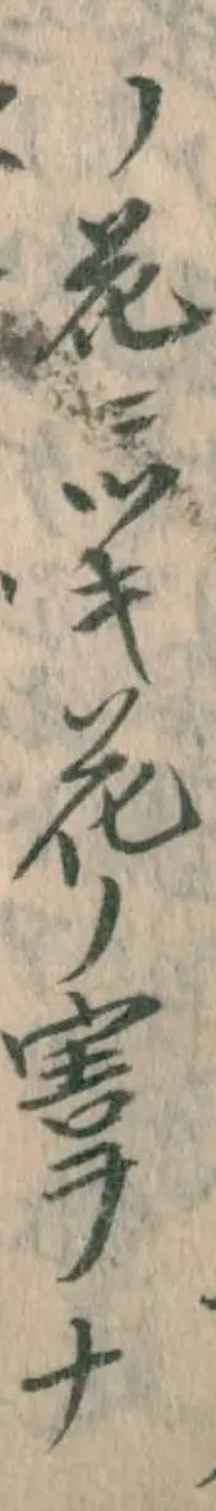ノ花ニツキ花ノ害ヲナ
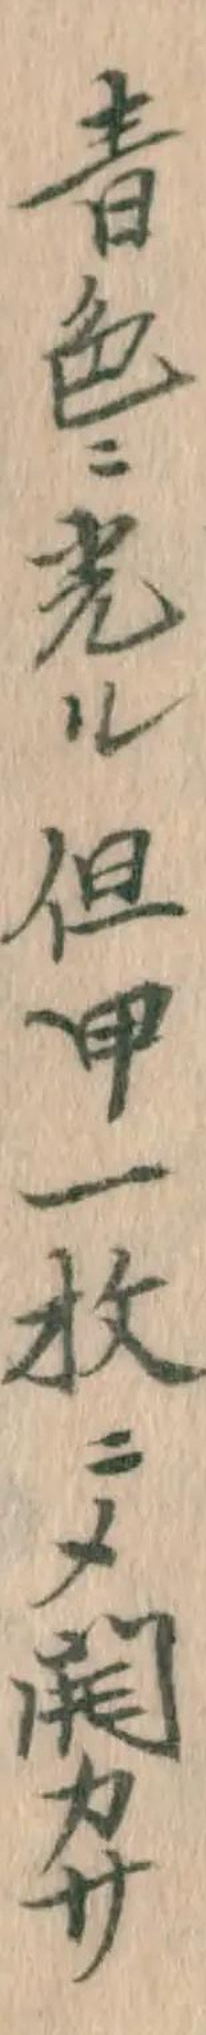青色ニ光ル但甲一枚ニシテ開カサ
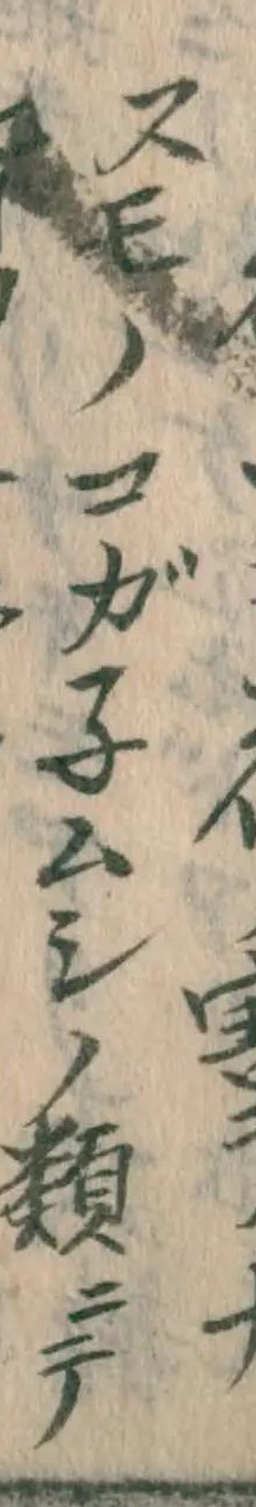スモノコガネムシノ類ニテ
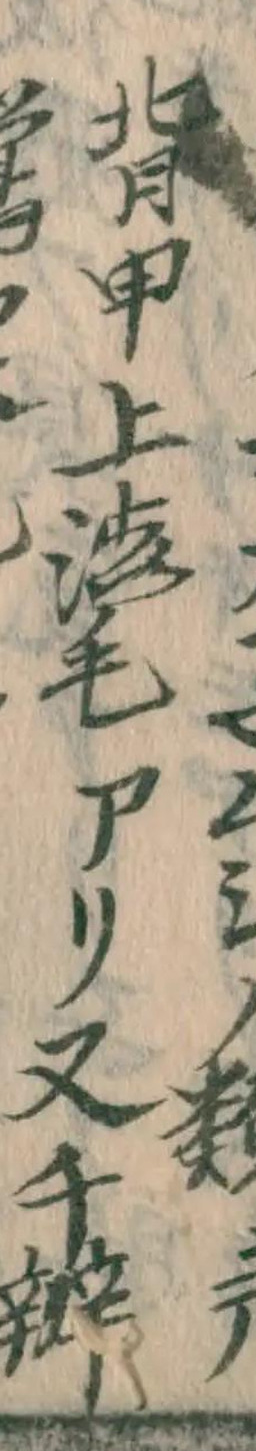背甲上渋毛アリ又千辨
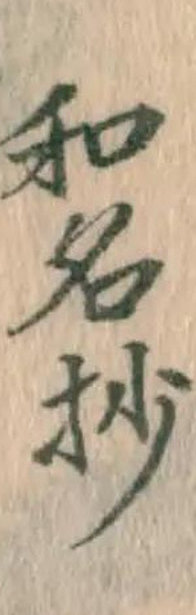和名抄
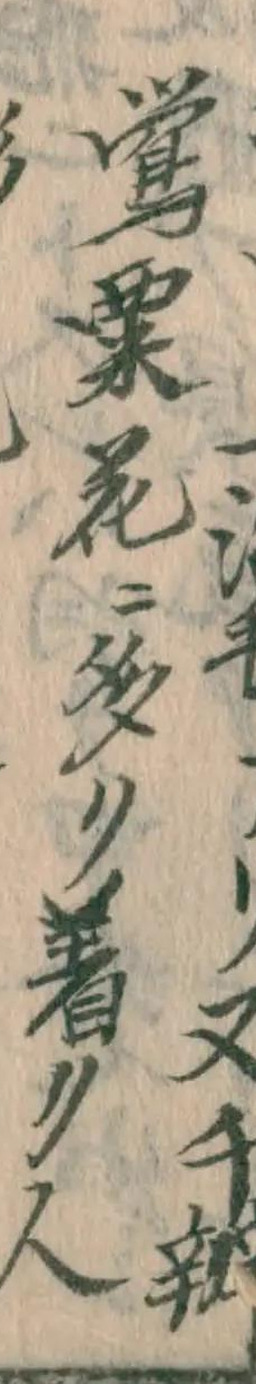鴬粟花ニ多ク着ク人
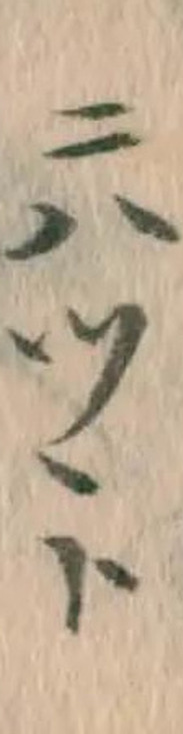ニハツヽト
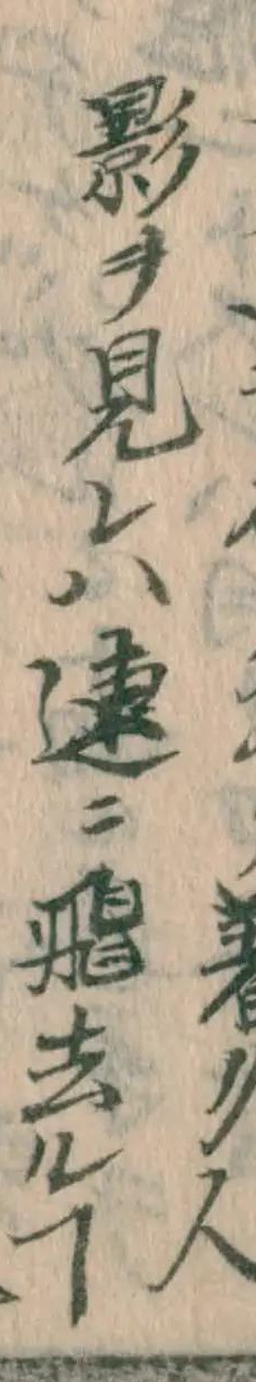影ヲ見レハ遠ニ飛去ルコト
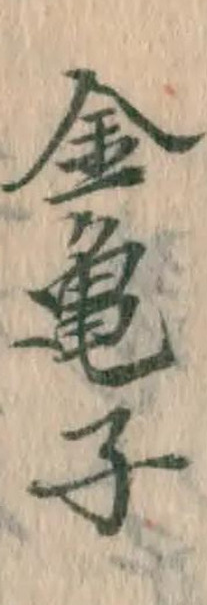金亀子
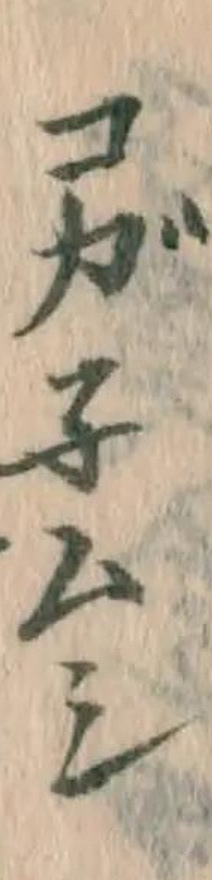コガネムシ
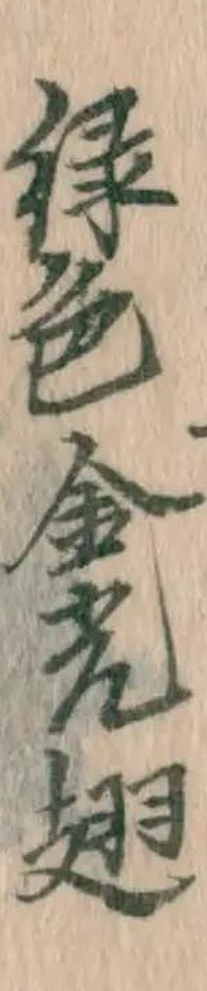緑色金光翅
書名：千蟲譜 3巻. [2]
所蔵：国立国会図書館 National Diet Library, JAPAN
